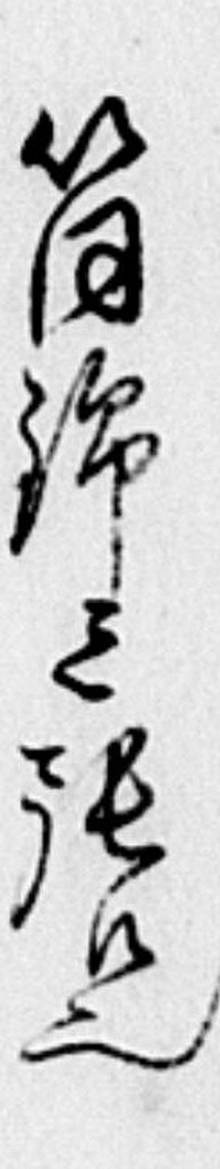筒錦にて張候也
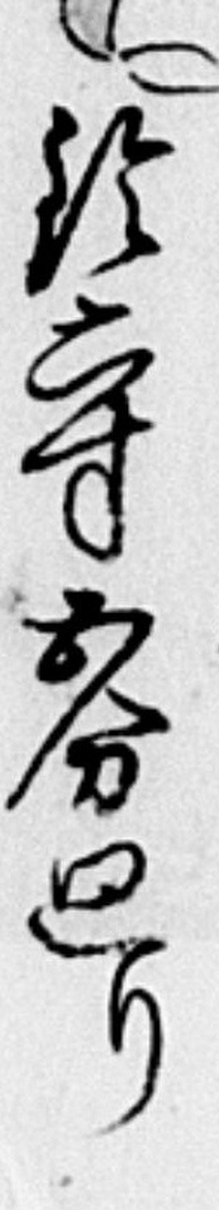鈴六寸五分廻り
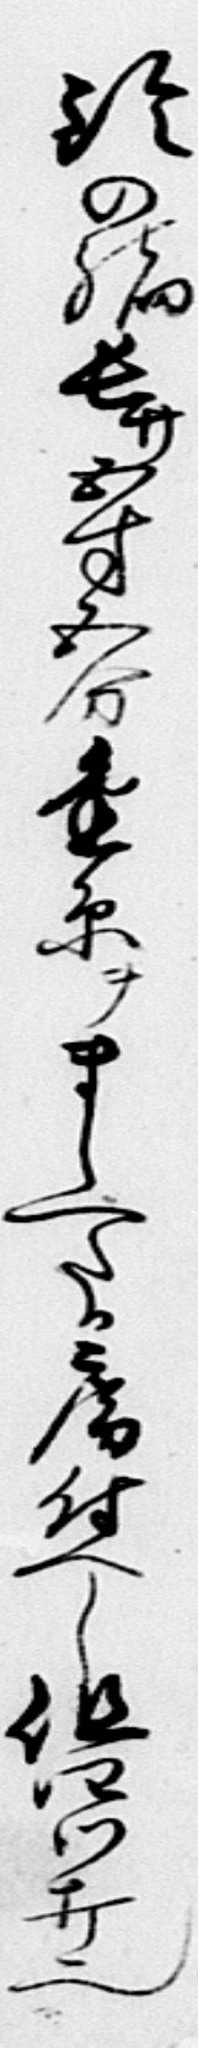鈴の緒長さ五寸五分金糸をましへたる房付へし但四つ打也

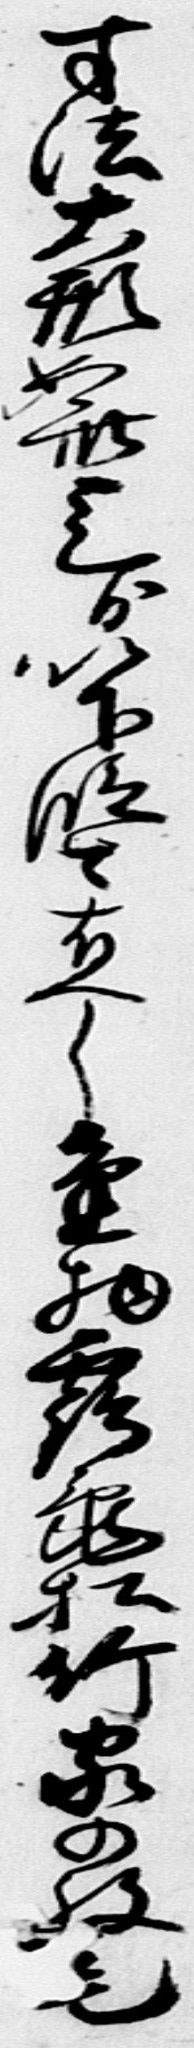寸法大形如此是より以下段も有へし金物鶴亀松竹家の紋毛
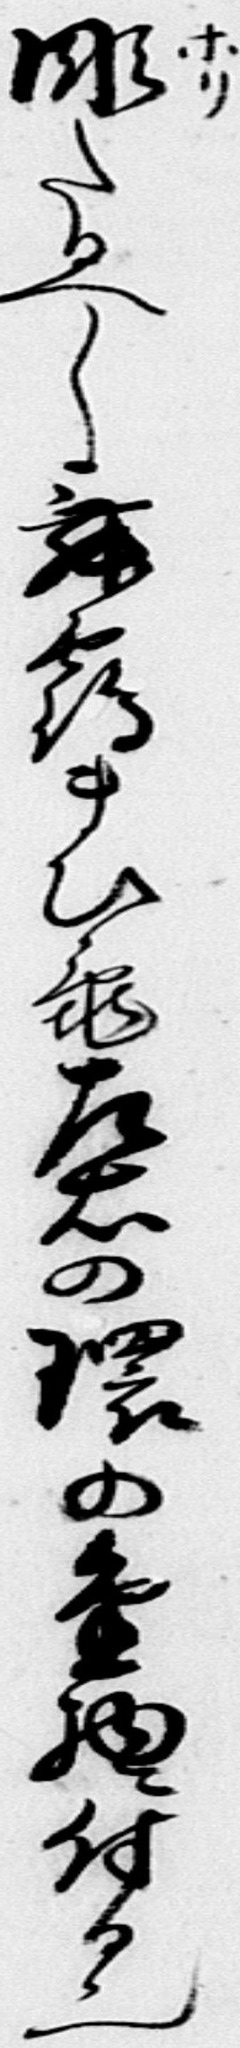彫たるへし舞鶴まひ亀左右の環の金物に付る也
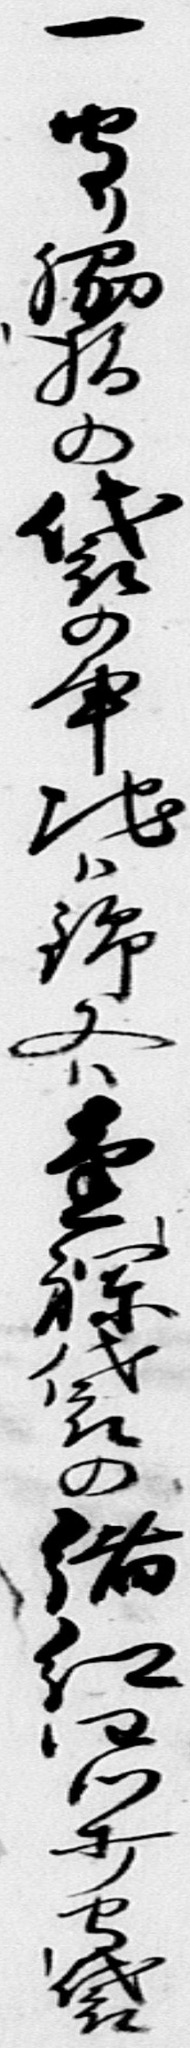一守り脇指の袋の事地は錦又は金襴袋の緒紅ひ四つ打守袋
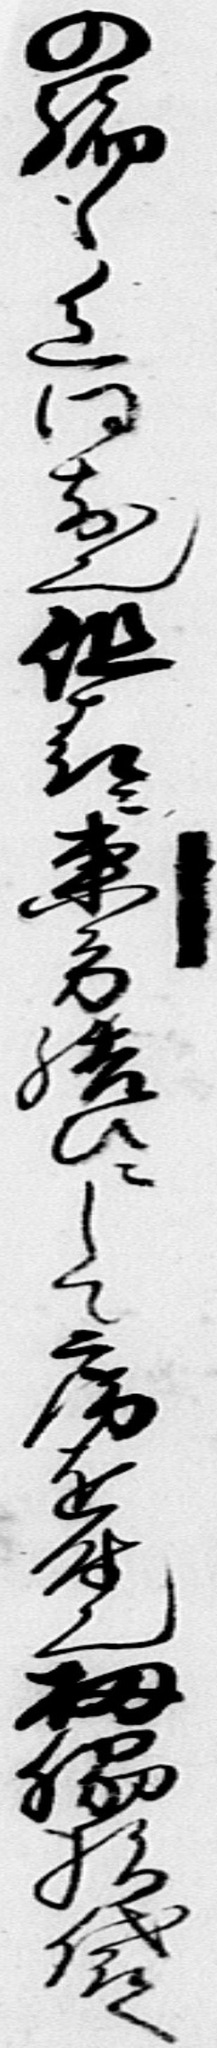の緒も色同前也但表に東方結ひにして房を付也扨脇指袋へ
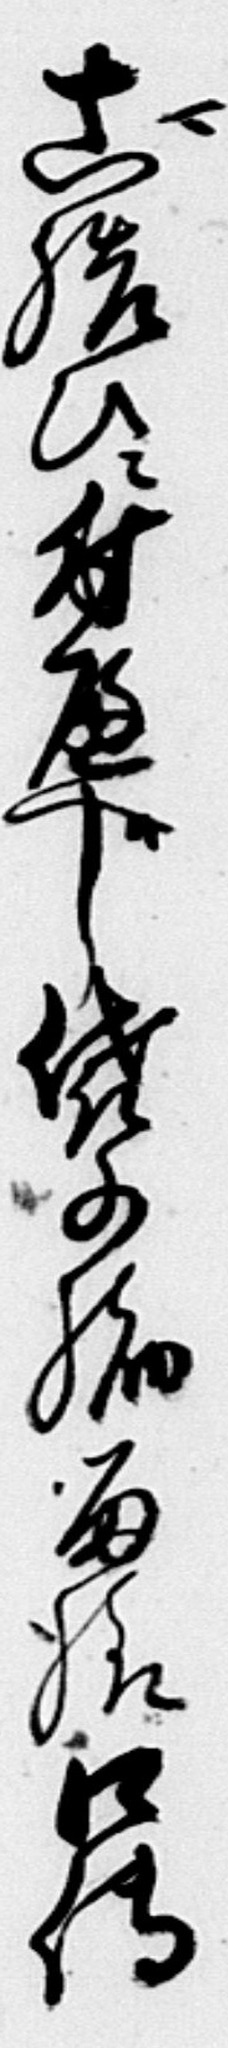真結ひに付へし袋の緒留様口伝
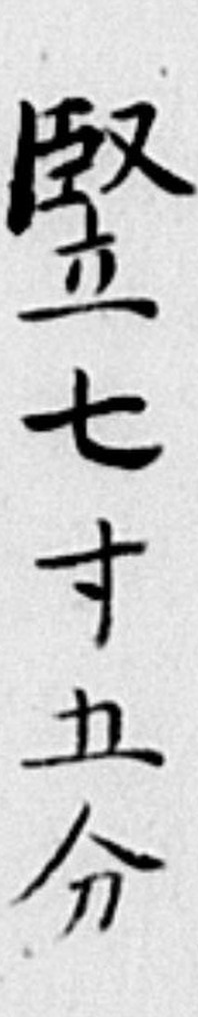竪七寸五分
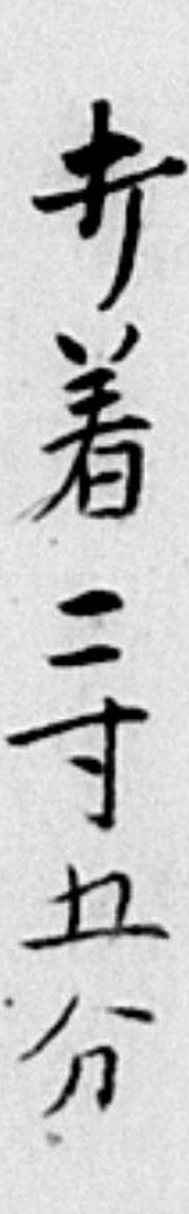打着二寸五分

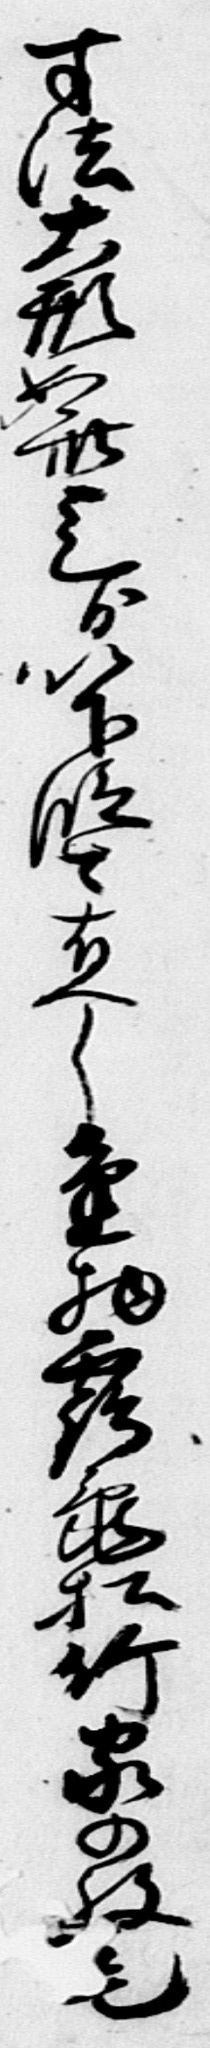寸法大形如此是より以下段も有へし金物鶴亀松竹家の紋毛
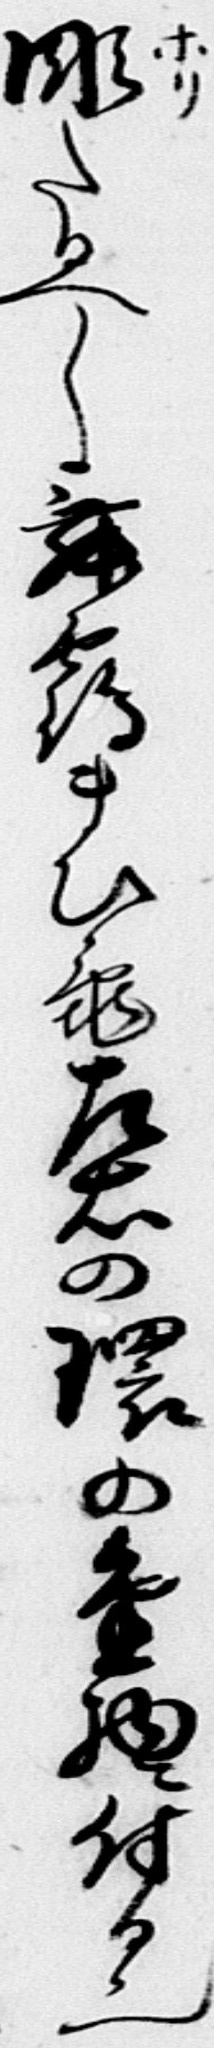彫たるへし舞鶴まひ亀左右の環の金物に付る也
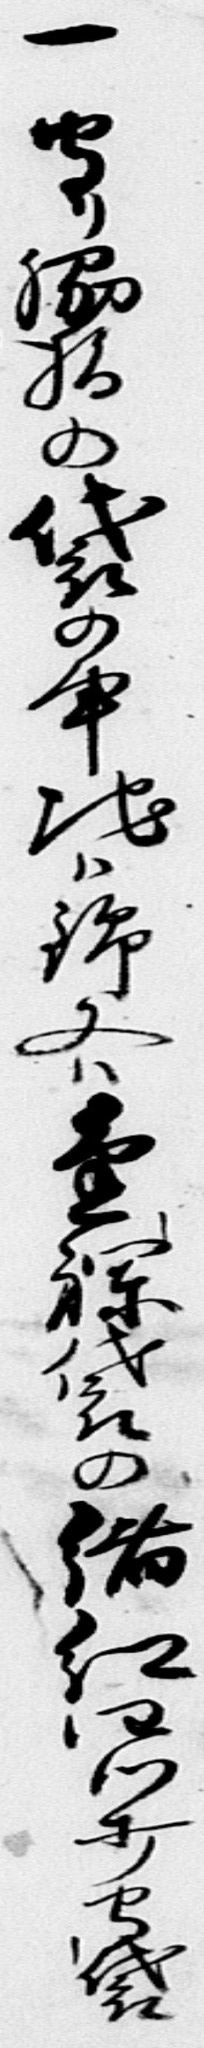一守り脇指の袋の事地は錦又は金襴袋の緒紅ひ四つ打守袋
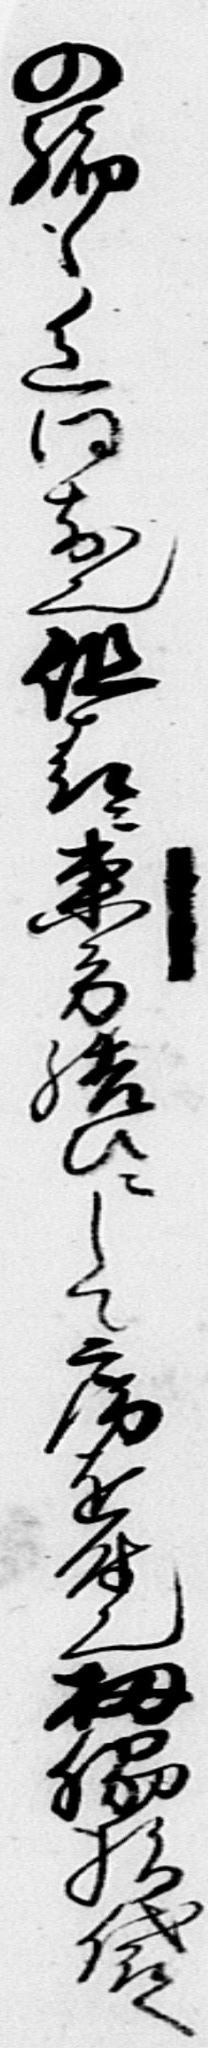の緒も色同前也但表に東方結ひにして房を付也扨脇指袋へ
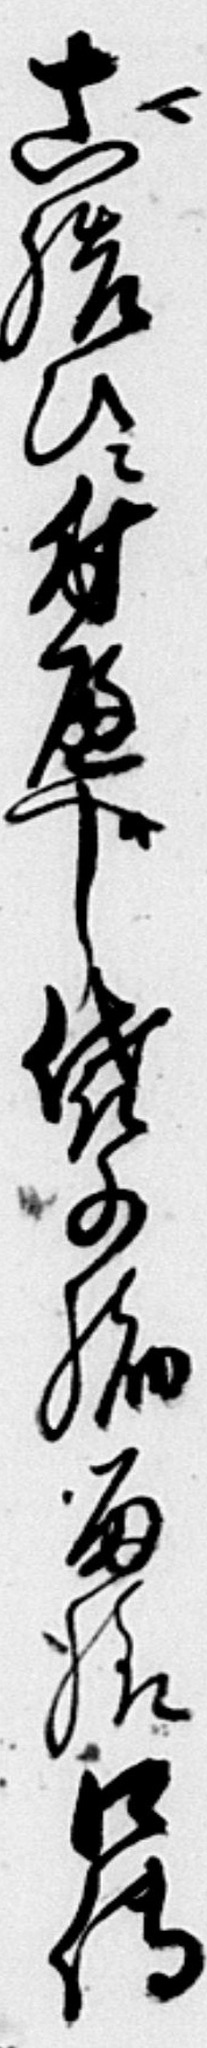真結ひに付へし袋の緒留様口伝
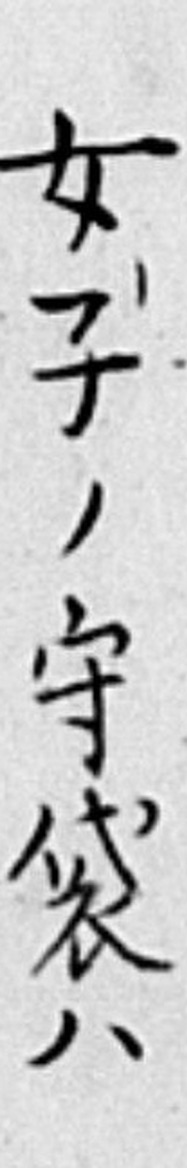女子ノ守袋ハ
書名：天児之書（あまがつのしょ）
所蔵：徳島県立図書館
